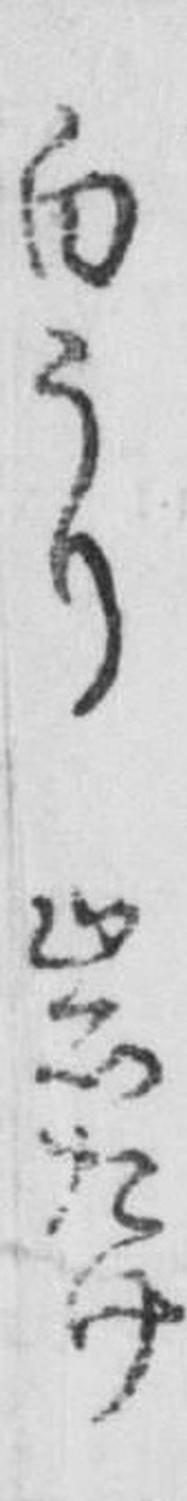白うり岩たけ
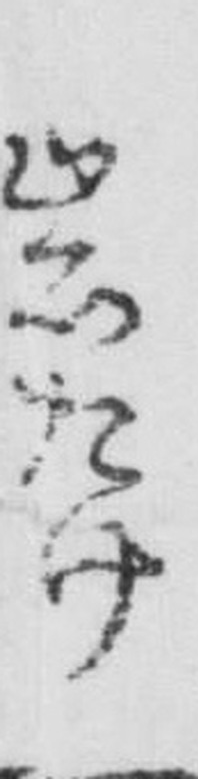岩たけ
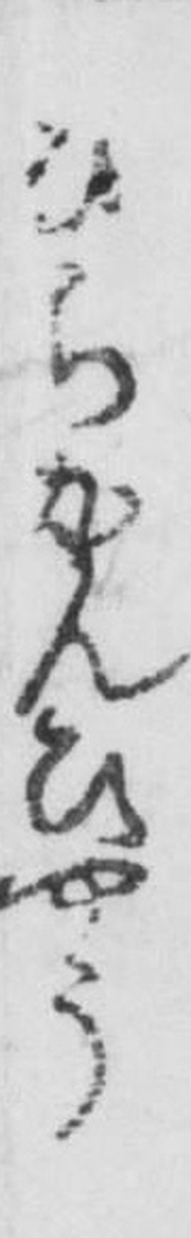ひらかんひやう
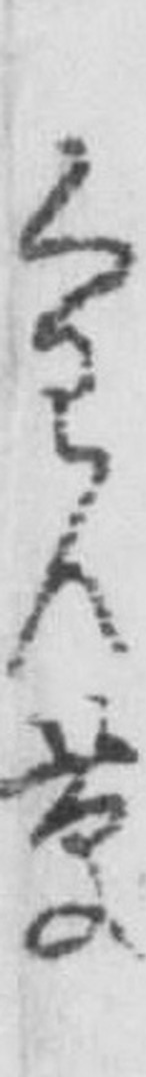くわん草
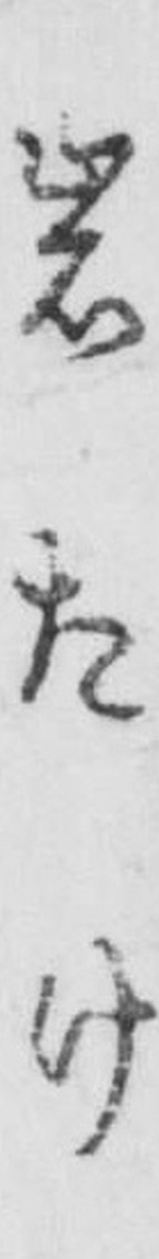岩たけ
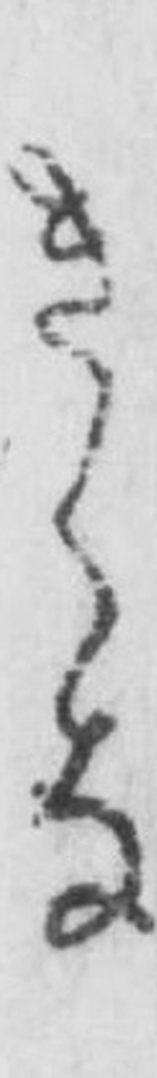きくな
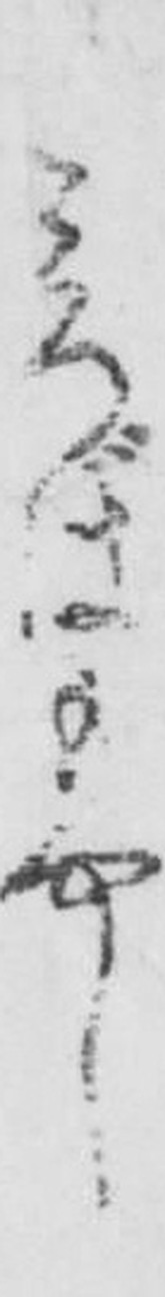みつばもやし
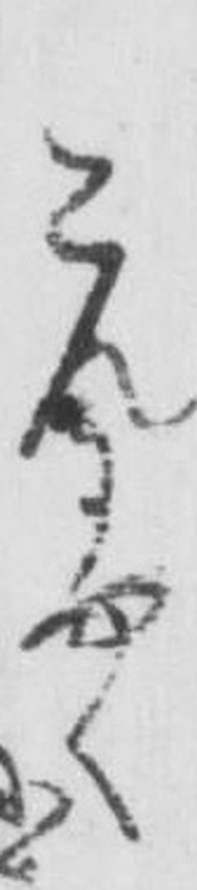こんにやく
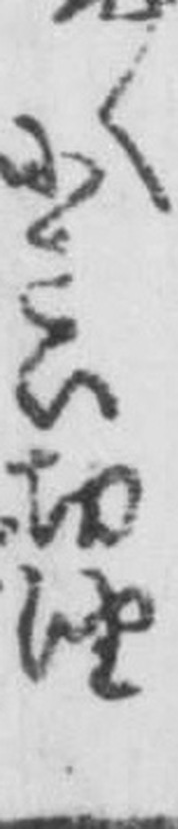小さい切油
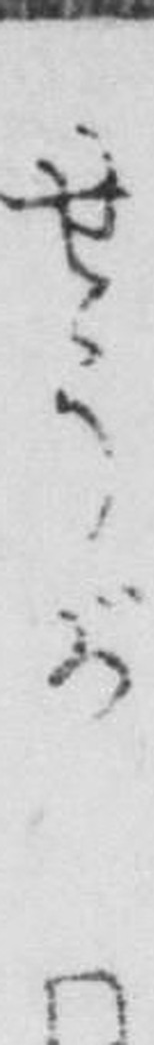せうが
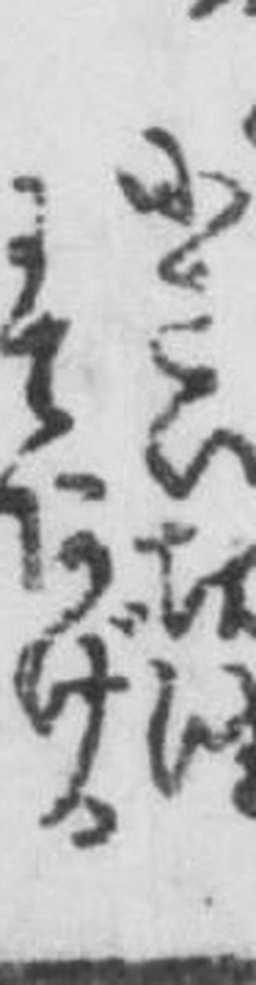にてあげる
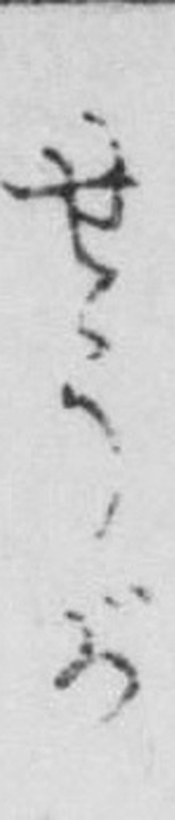せうが
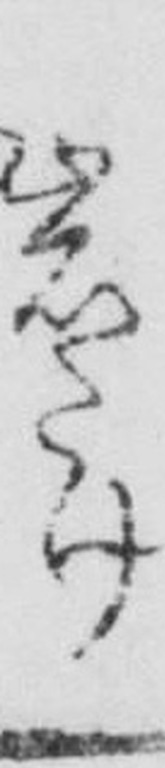岩たけ
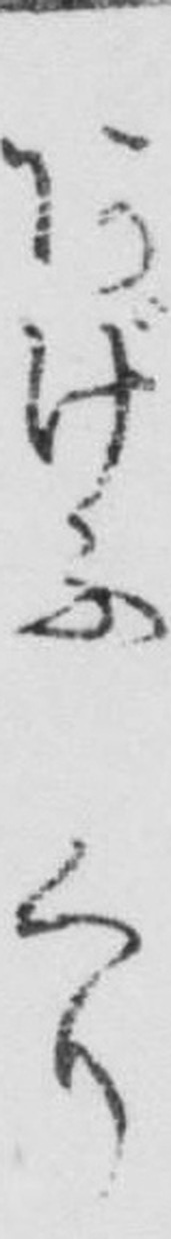あげふくり
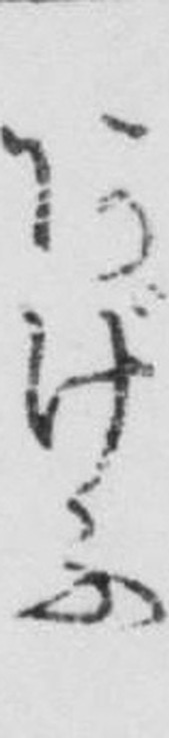あげふ
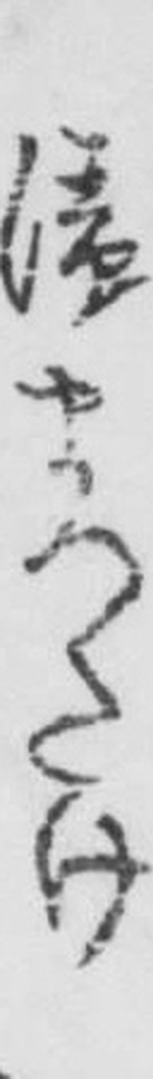漬まつたけ
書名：諸家通用/即席料理
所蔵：大阪府立大学学術情報センター 国文学研究資料館
